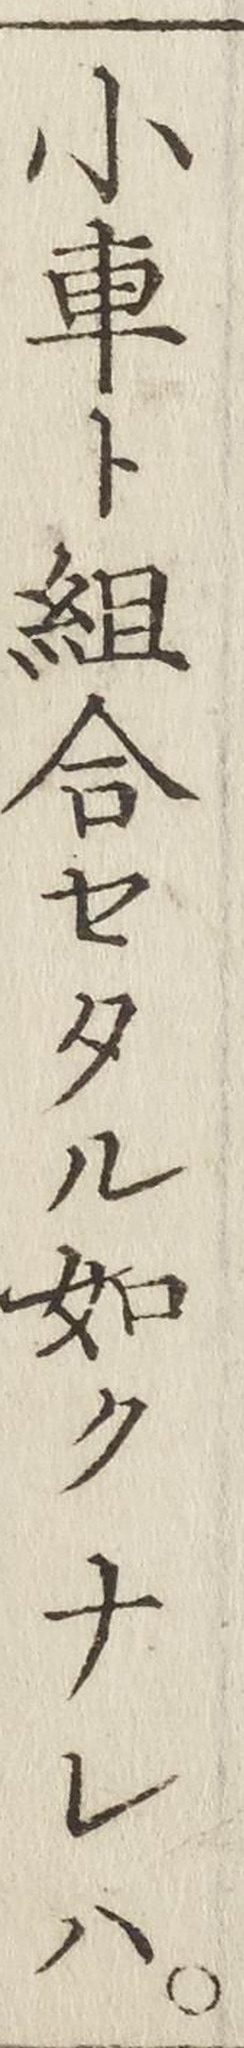小車ト組合セタル如クナレハ。
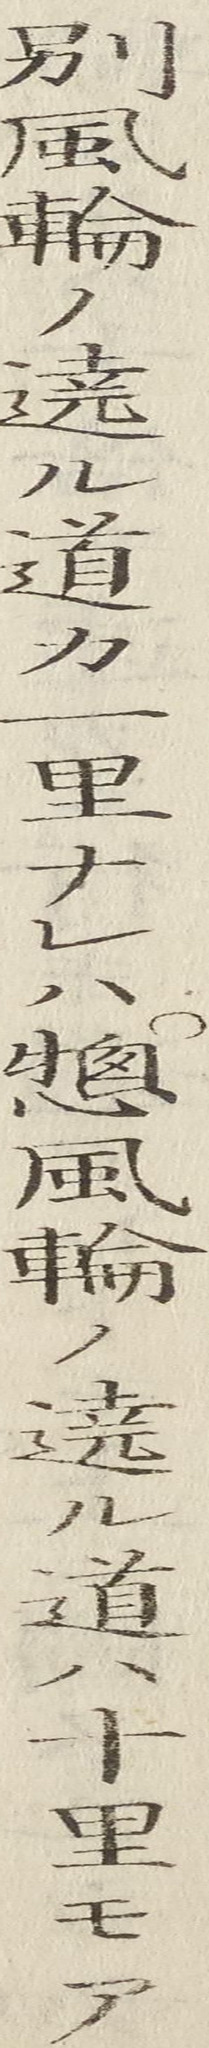別風輪ノ遶道カ一里ナレハ。惣風輪ノ遶ル道ハ十里モア
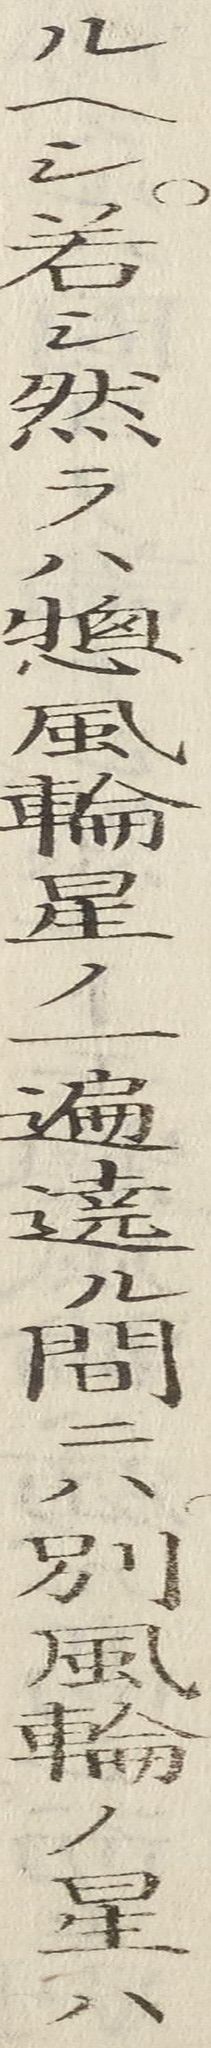ルヘシ。若シ然ラハ惣風輪星ノ一遍遶ル間ニハ。別風輪ノ星ハ
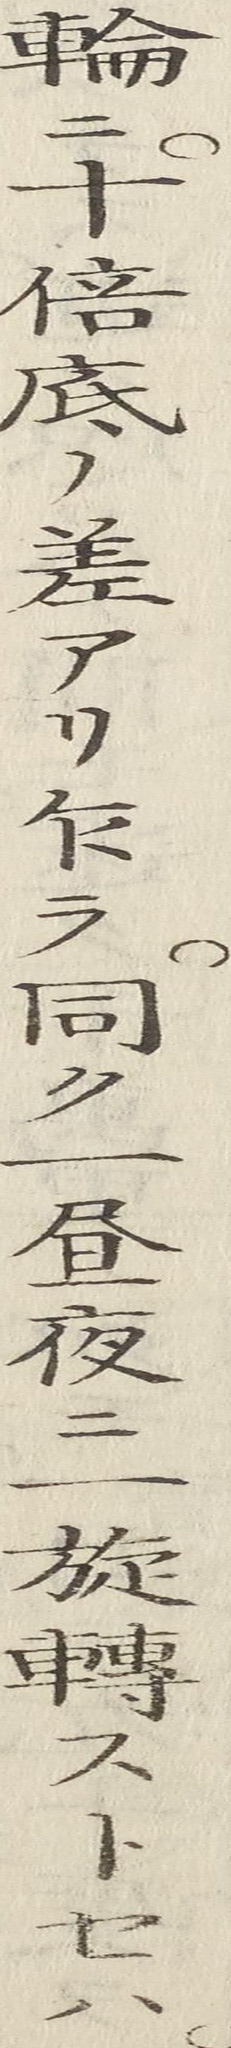輪ニ。十倍底ノ差アリ乍ラ。同ク一昼夜ニ一旋転ストセハ。
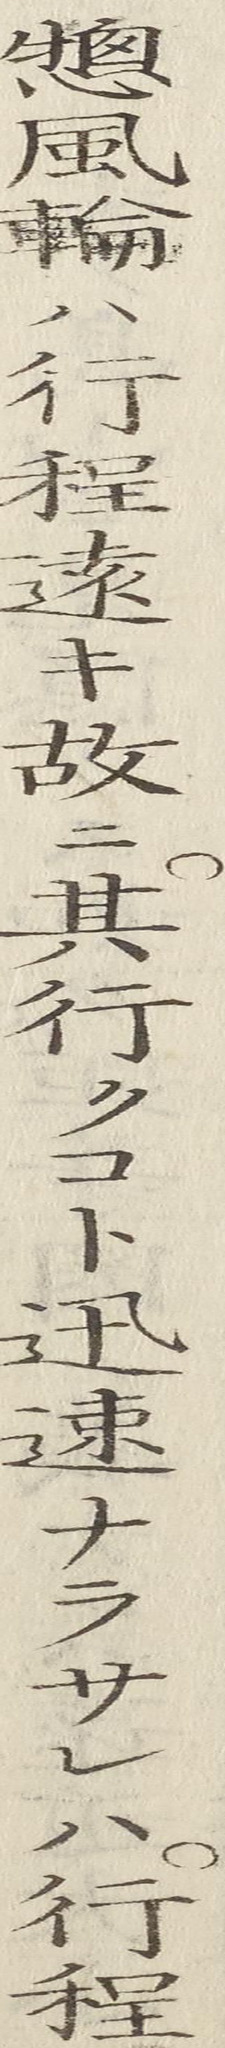惣風輪ハ行程遠キ故ニ。其行クコト迅速ナラサレハ。行程
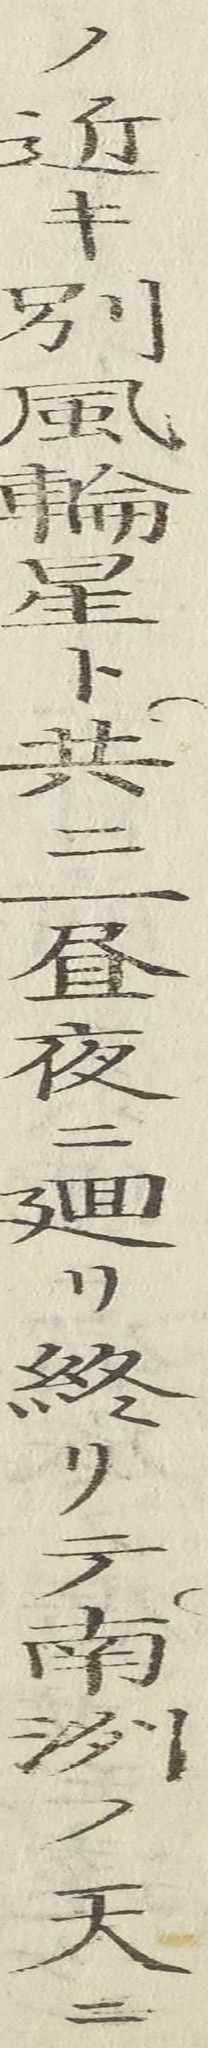ノ近キ別風輪星ト。共ニ一昼夜ニ廻リ終リテ。南洲ノ天ニ
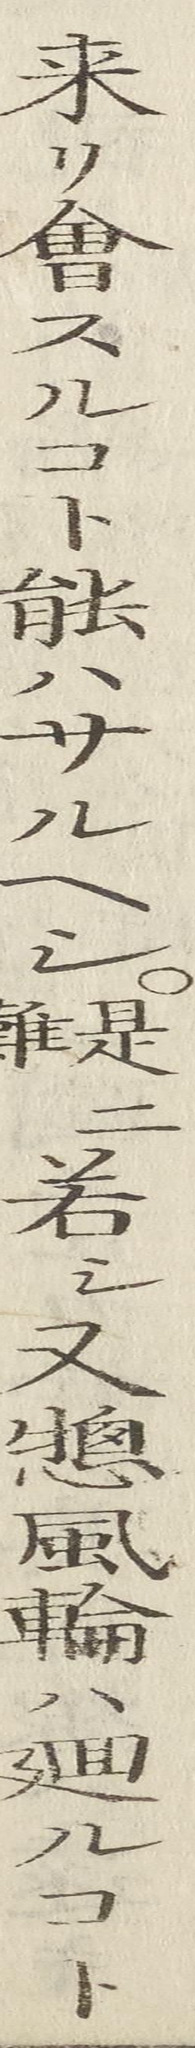来リ会スルコト能ハサルヘシ。是ニ難若シ又惣風輪ハ廻ルコト
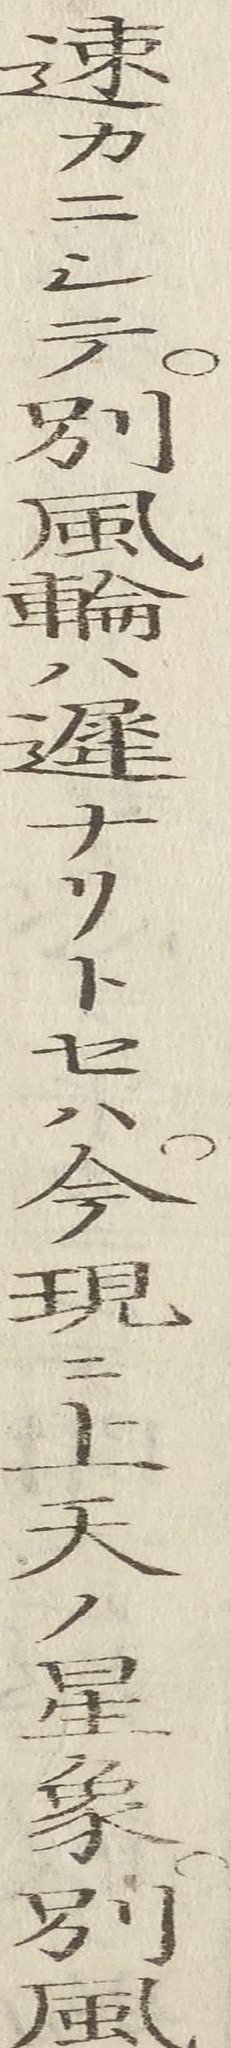速カニシテ。別風輪ハ遅ナリトセハ。今現ニ上天ノ星象。別風
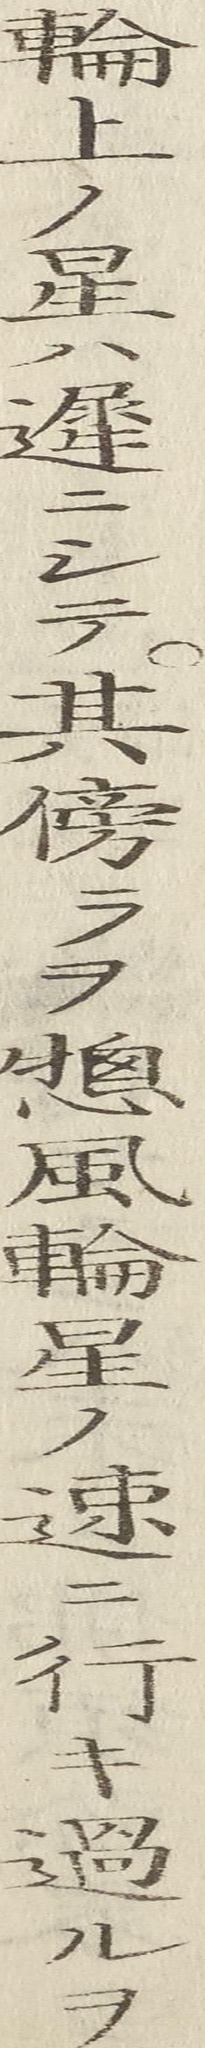輪上ノ星ハ遅ニシテ。其傍ラヲ惣風輪星ノ速ニ行キ過ルヲ
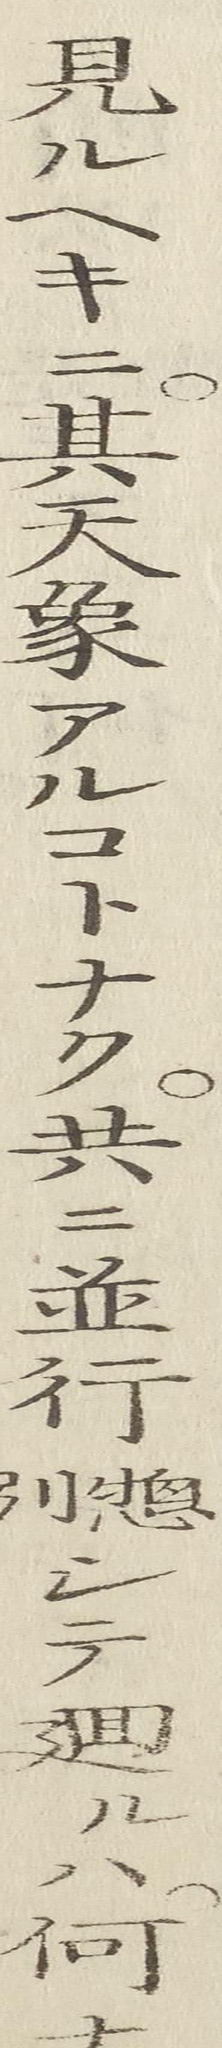見ルヘキニ。其天象アルコトナク。共ニ並行惣別シテ廻ルハ。何ナ

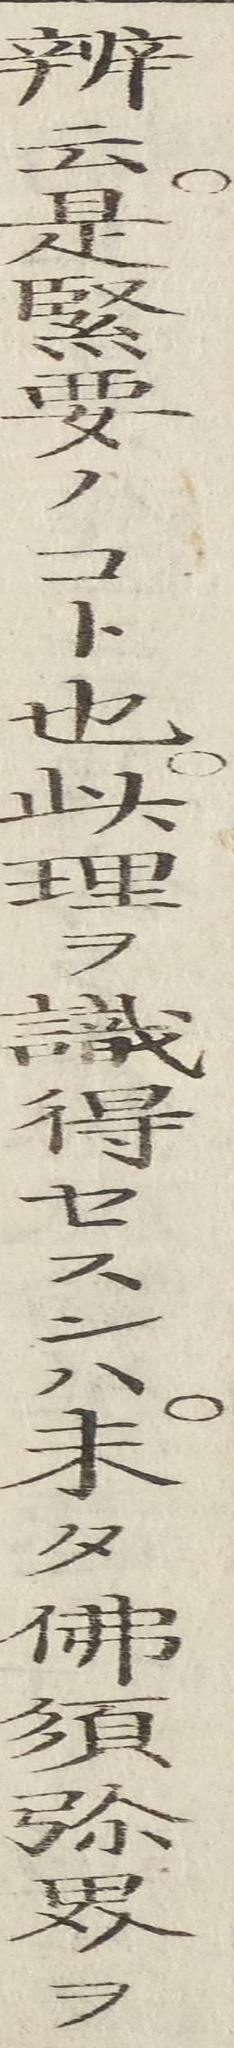弁云。是緊要ノコト也。此理ヲ識得セスンハ。未タ仏須弥界ヲ
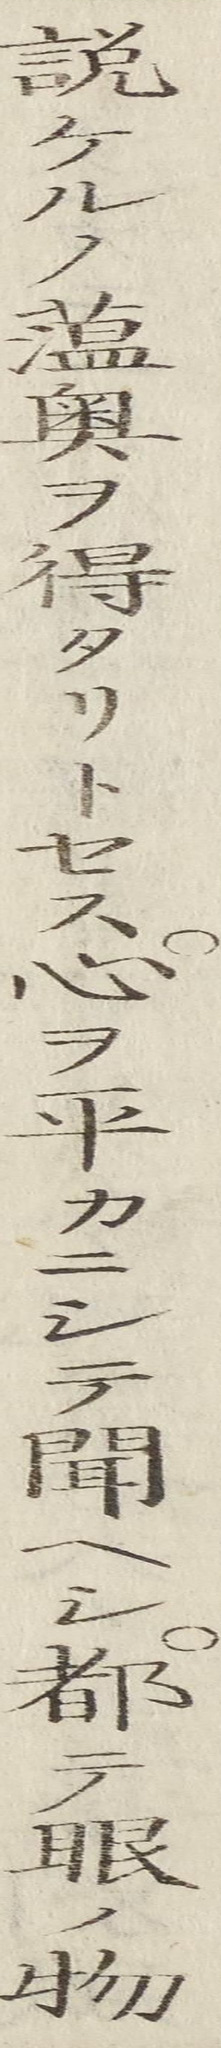説ケルノ薀奥ヲ得タリトセス。心ヲ平カニシテ聞ヘシ。都テ眼ノ物
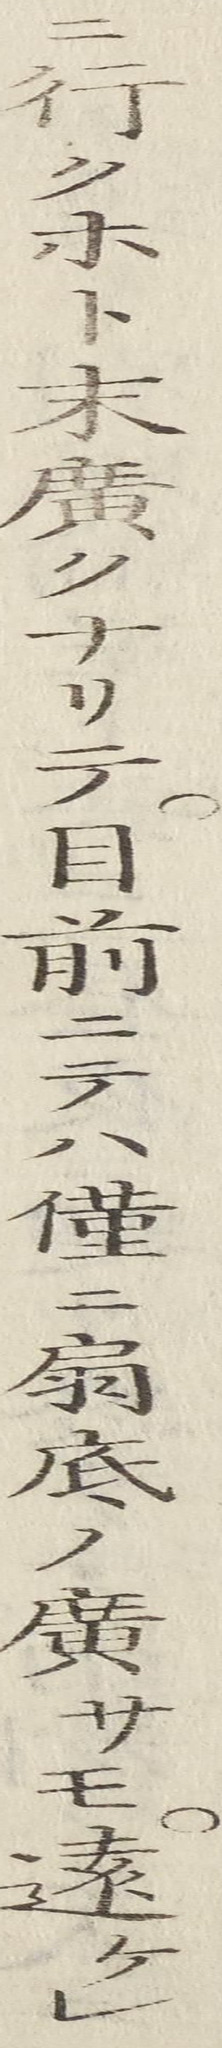ニ行クホト末広クナリテ。目前ニテハ僅ニ扇底ノ広サモ。遠ケレ
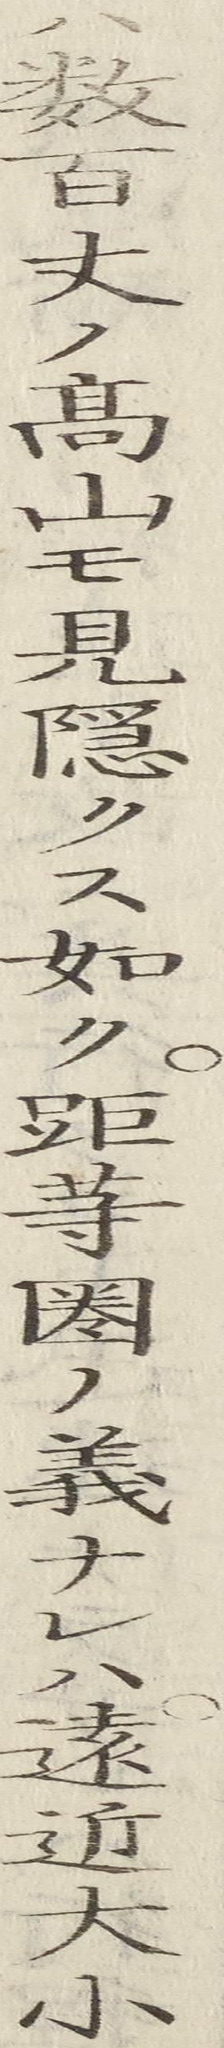ハ数百丈ノ高山モ見隠クス如ク。距等圏ノ義ナレハ。遠近大小
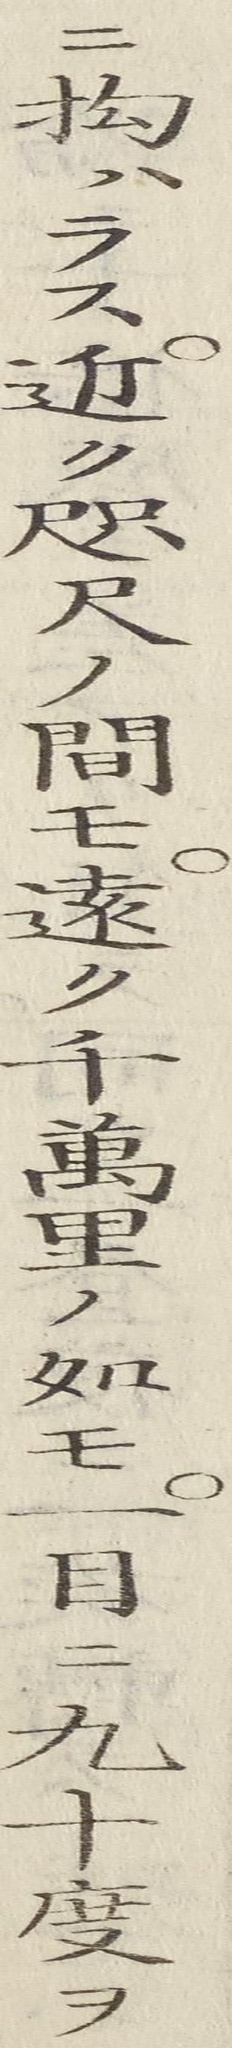ニ拘ハラス。近ク咫尺ノ間モ。遠ク千万里ノ如モ。一目ニ九十度ヲ
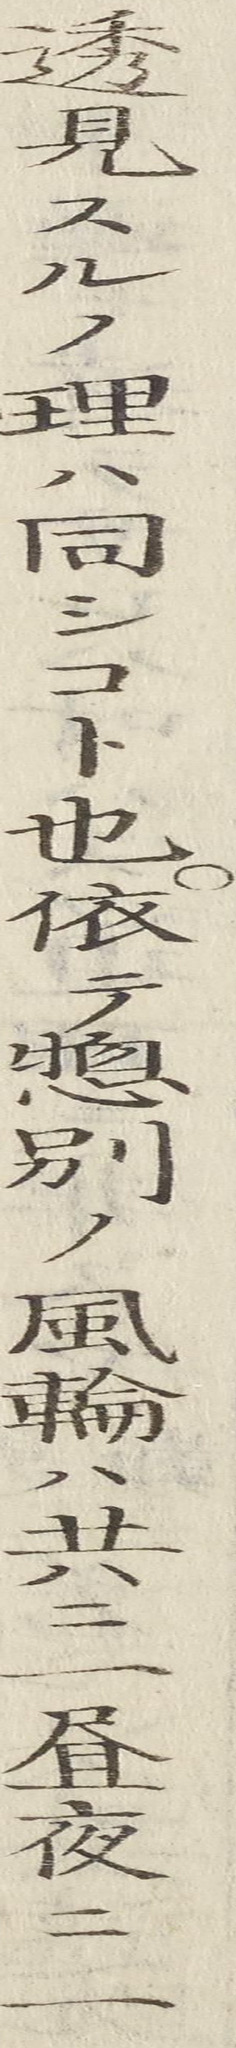透見スルノ理ハ同シコト也。依テ惣別ノ風輪ハ共ニ一昼夜ニ一
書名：護法新論　二編　上
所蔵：東京大学地震研究所図書室 Earthquake Research Institute Library, The University of Tokyo, JAPAN
